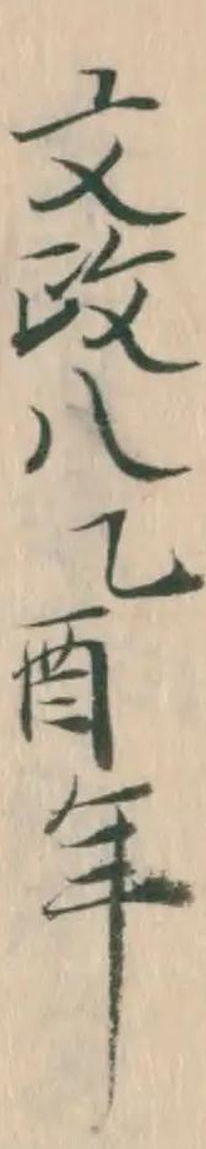文政八乙酉年
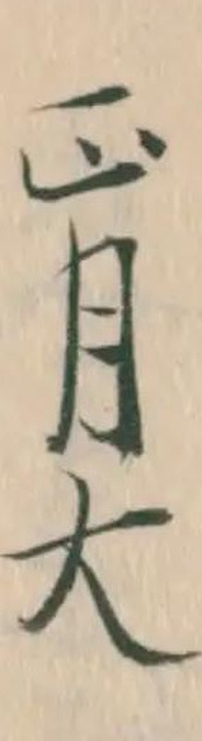正月大
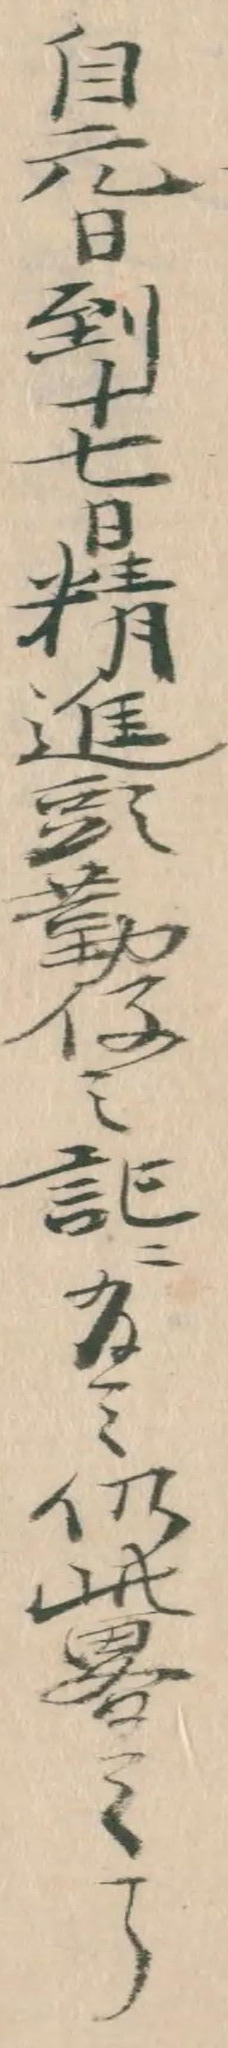自元日到十七日精進頭勤役之記ニ有之仍此略之了
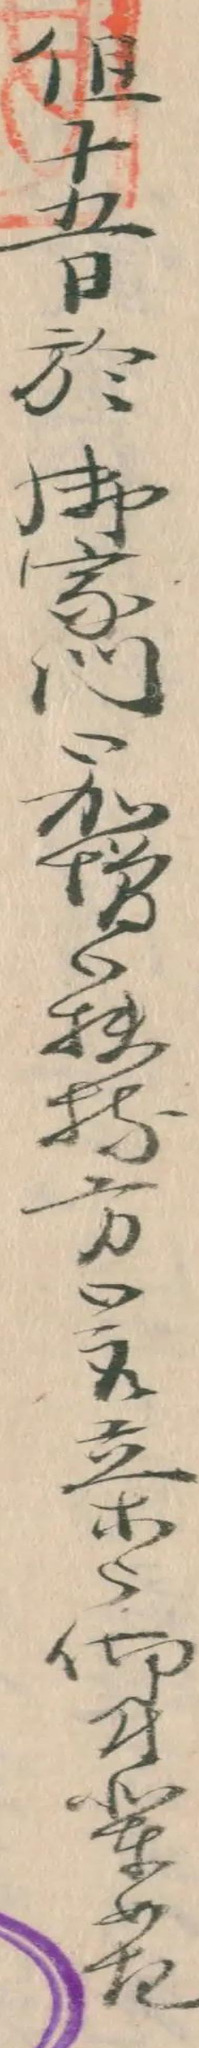但十五日於御家門御加増御扶持方御取立等被仰付輩如左
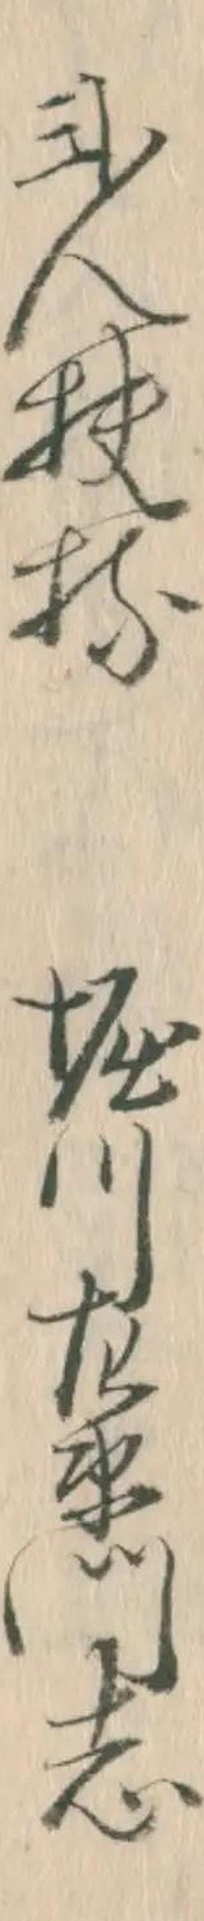弐人扶持堀川左衛門志
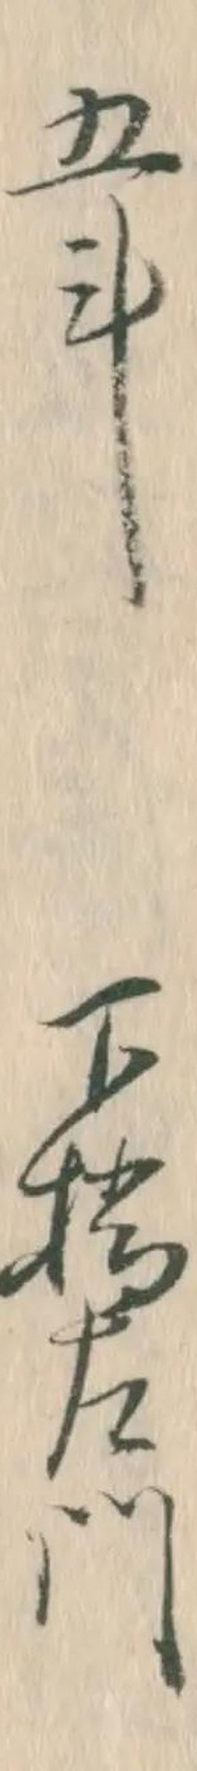五斗下橋左門
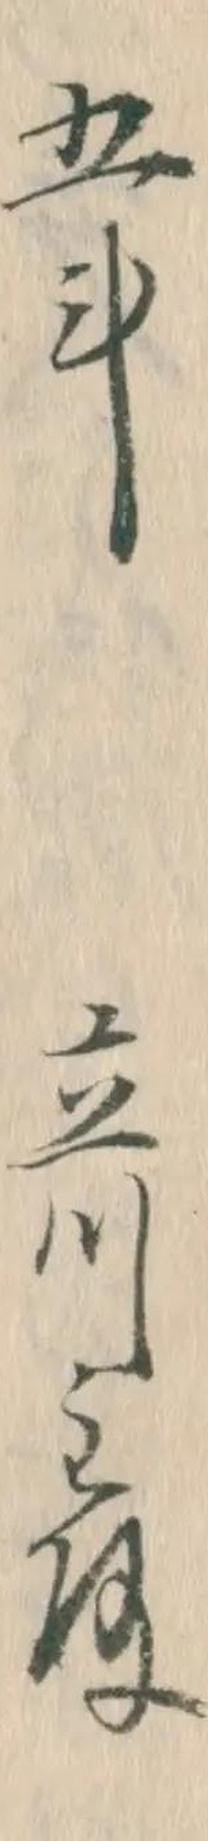五斗立川主殿
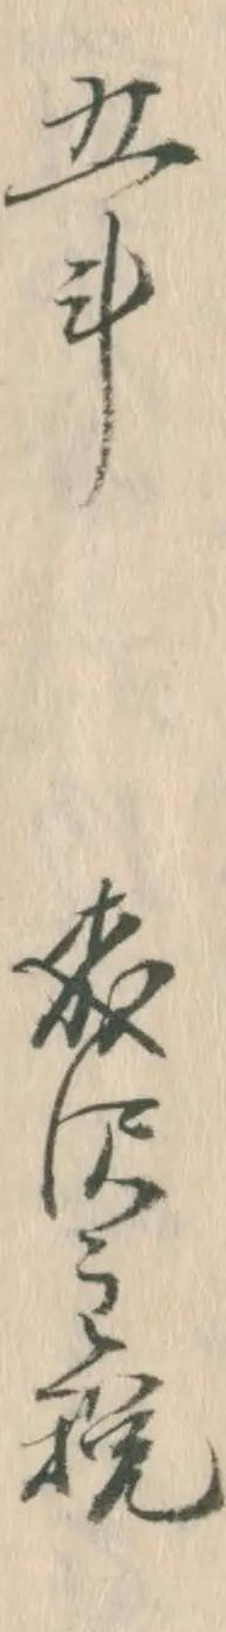五斗森沢主税
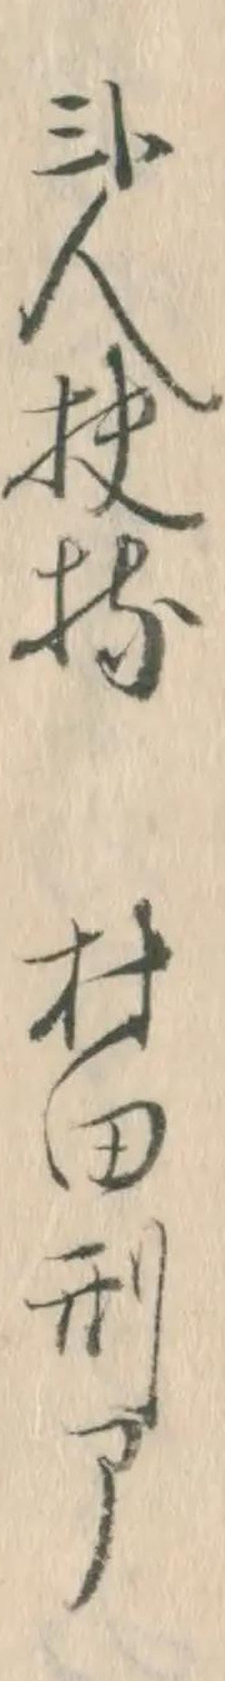弐人扶持村田刑部
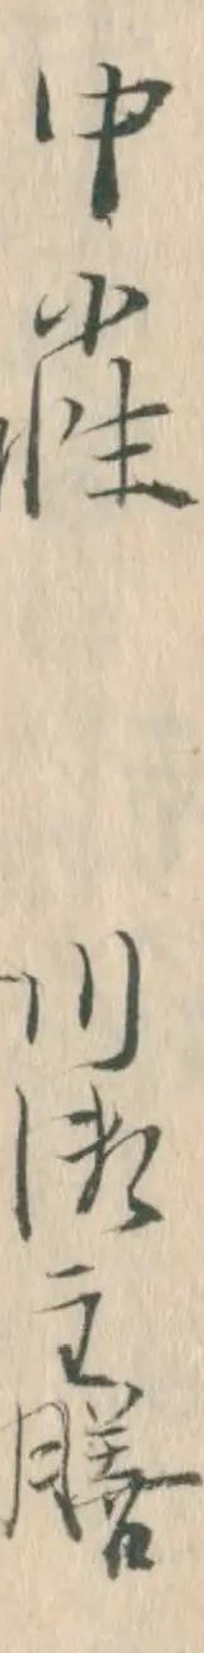中小性川御主膳
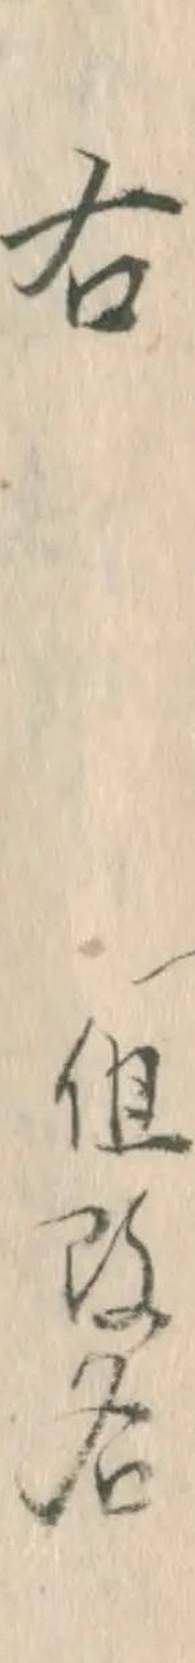右但改名
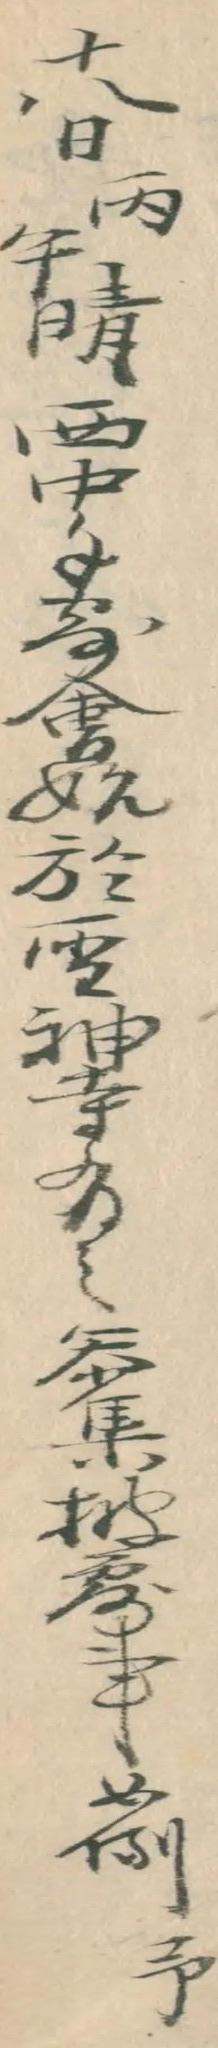十八日丙午晴西中手寄會始於聖神寺有之参集披露事如例予

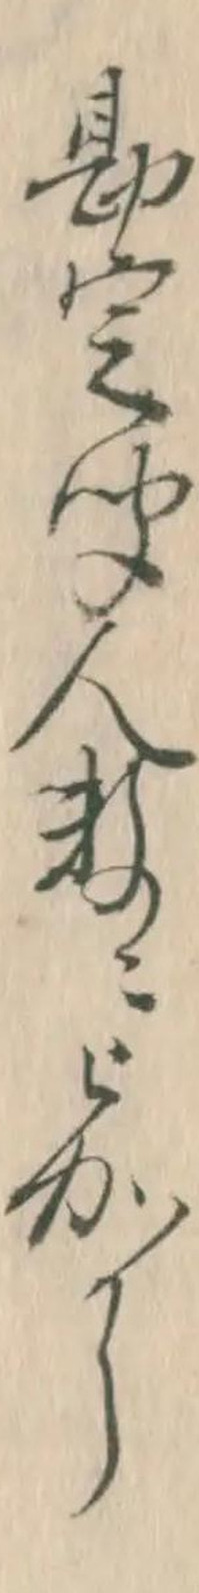勘定聞人数に被加了
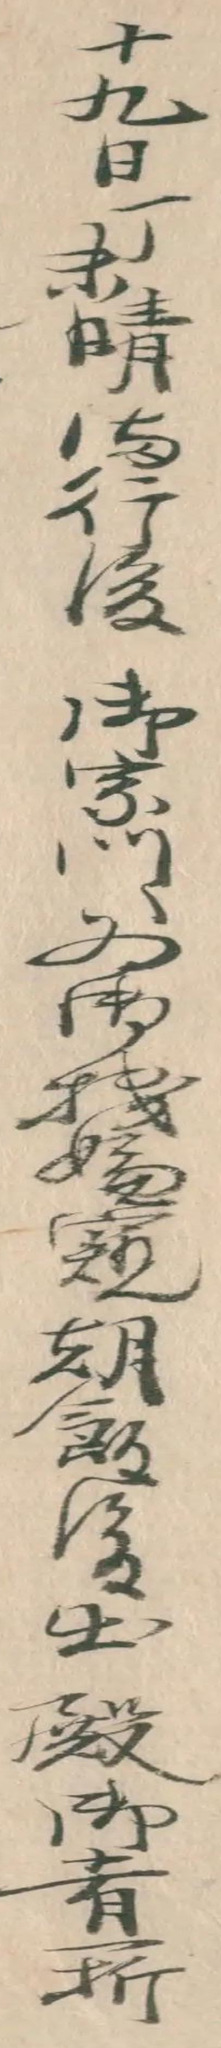十九日丁未晴満行後御家門へ為御機嫌窺朝飯後出殿御肴一折
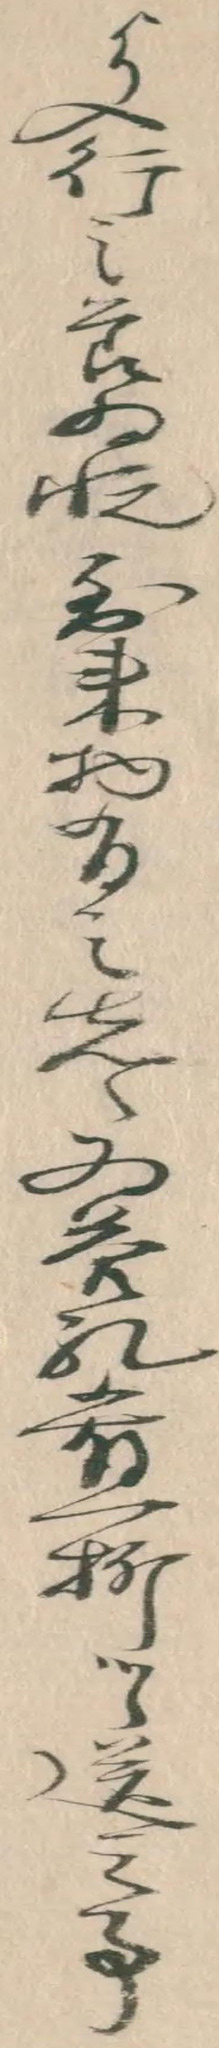より入行之節為悦到来物有之先へ為答礼肴一折ツヽ送之事
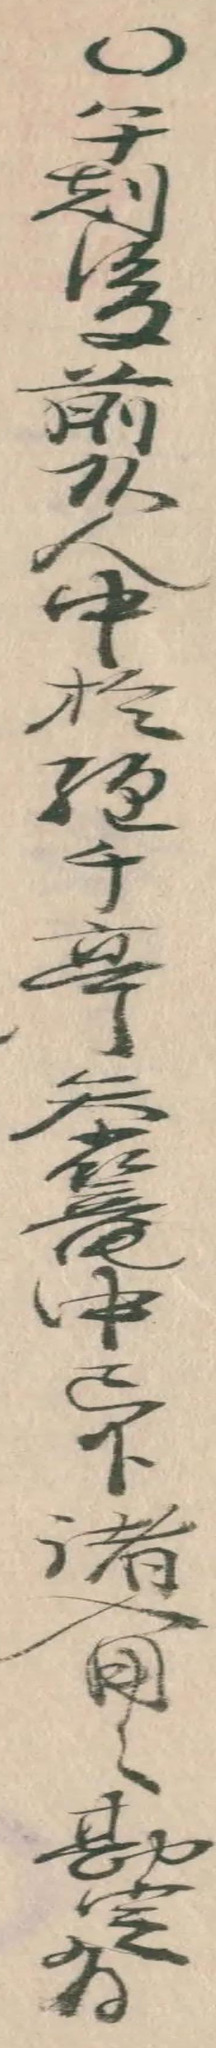○午刻後前頭人中於経千亭参篭中已下諸入用之勘定有
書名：賀茂社記録. 第65冊
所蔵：国立国会図書館 National Diet Library, JAPAN
